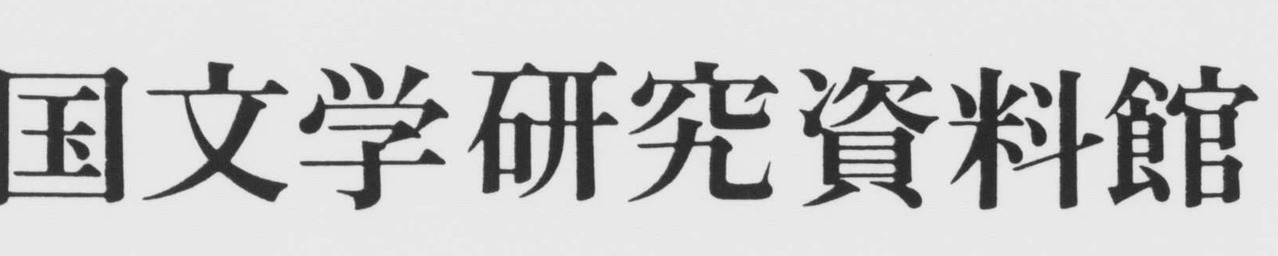国文学研究資料館

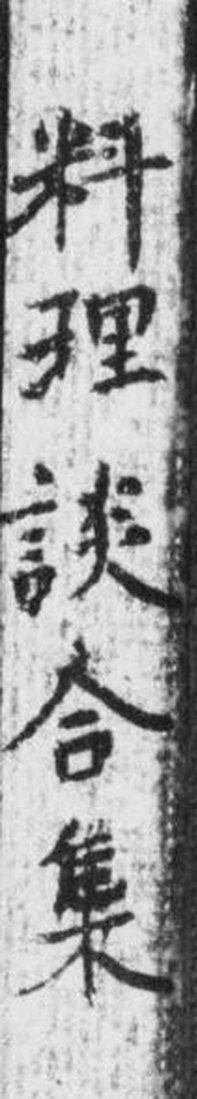料理談合集
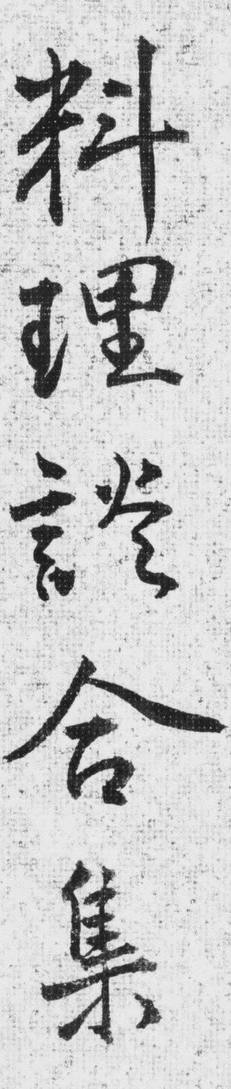料理談合集

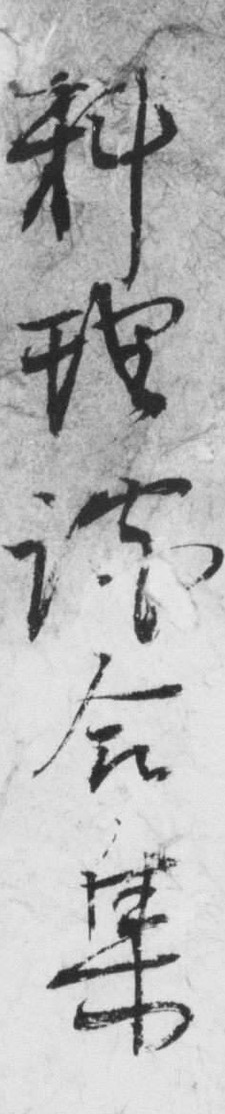料理談合集

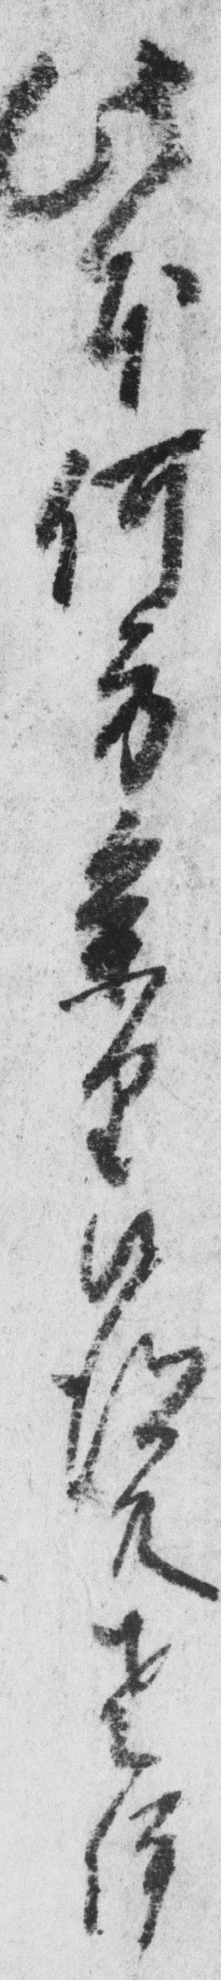此本出方参り候得共さい
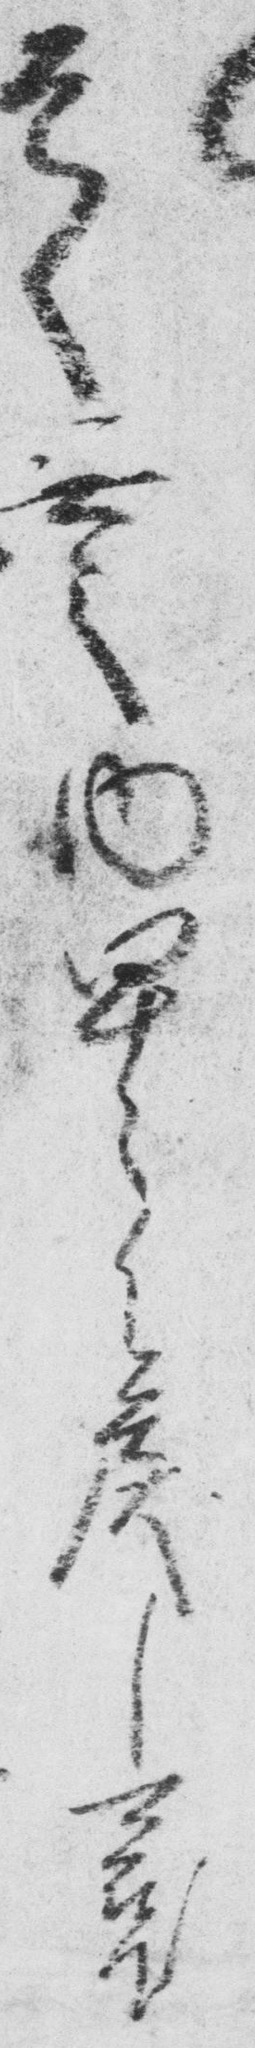そく無く内早早々戻し可被下
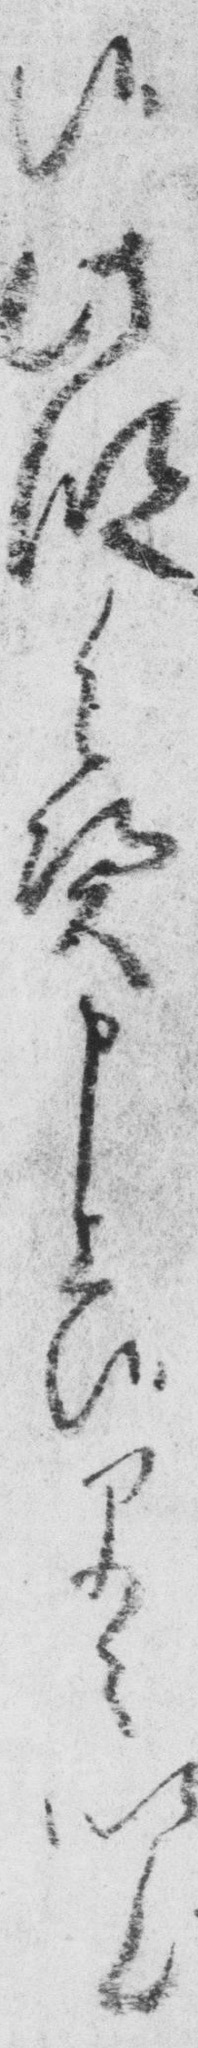候此段之資？申上候早々以上
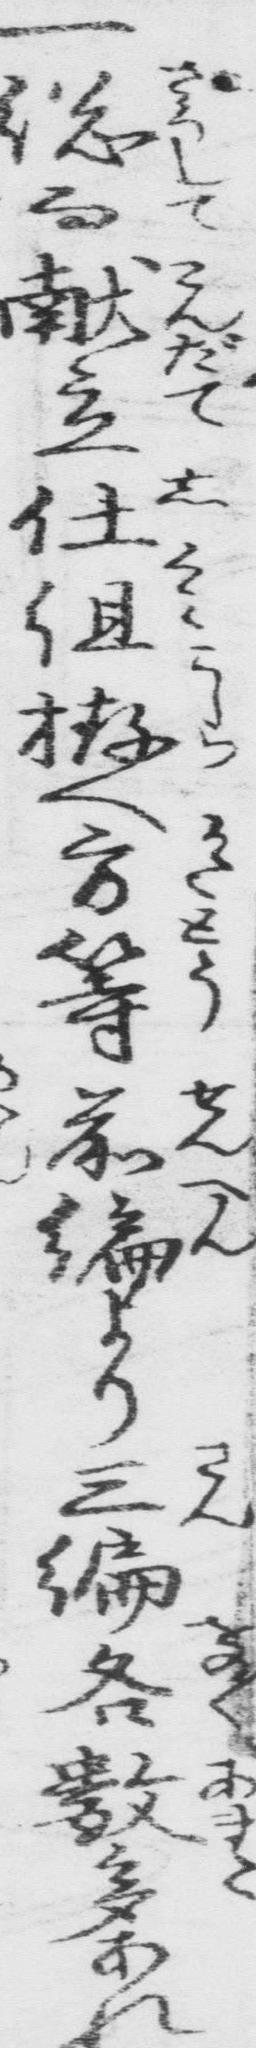一総而献立仕組み拵へ方等前編より三編各数多あれ
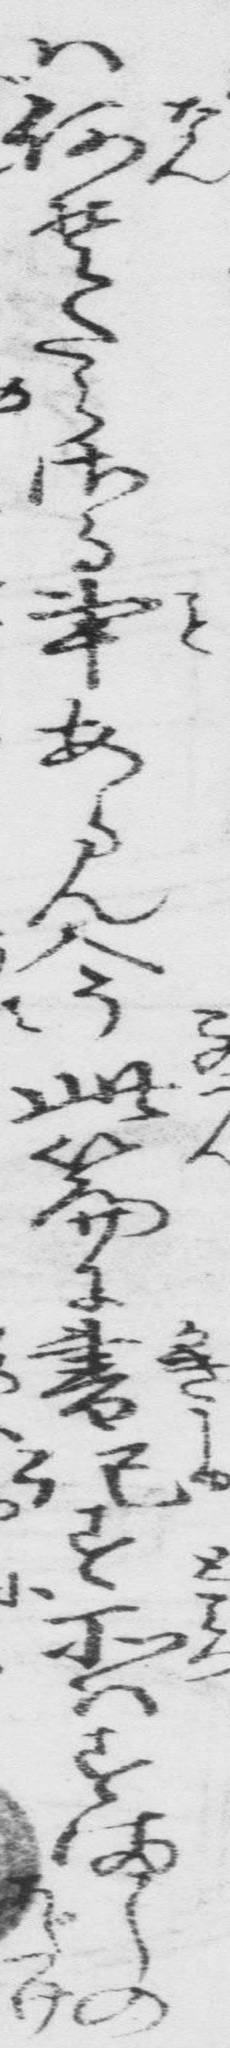は何そたらさる事あらん今此篇に書記す所はすましの
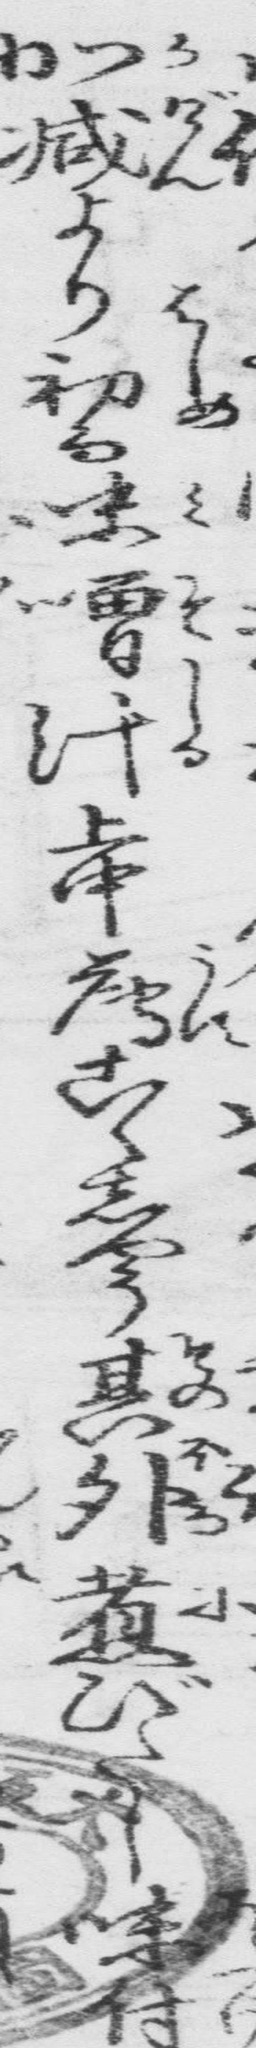加減より初而味噌汁上中薄こくしやう其外煮びたし味付
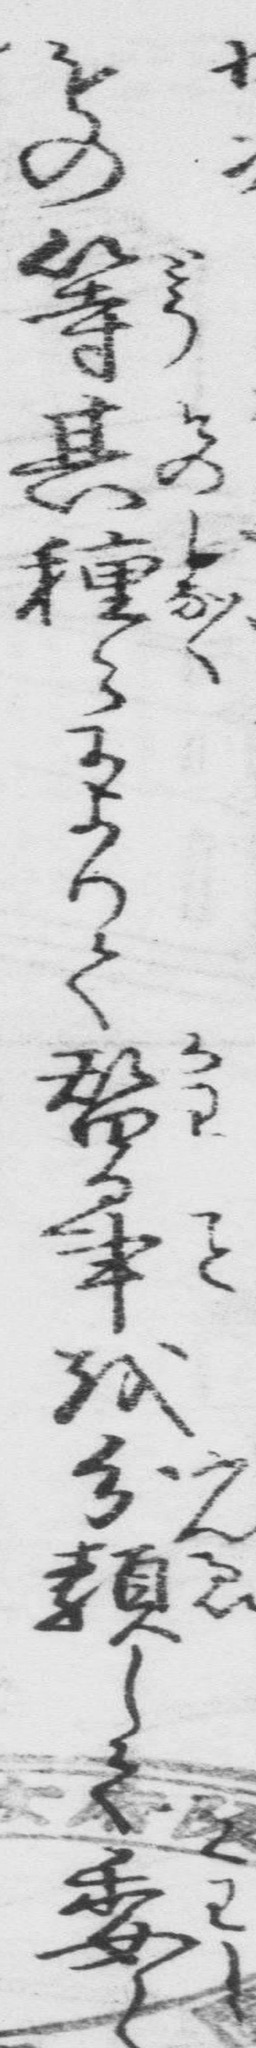もの等其種々によりて替る事を分類して委く
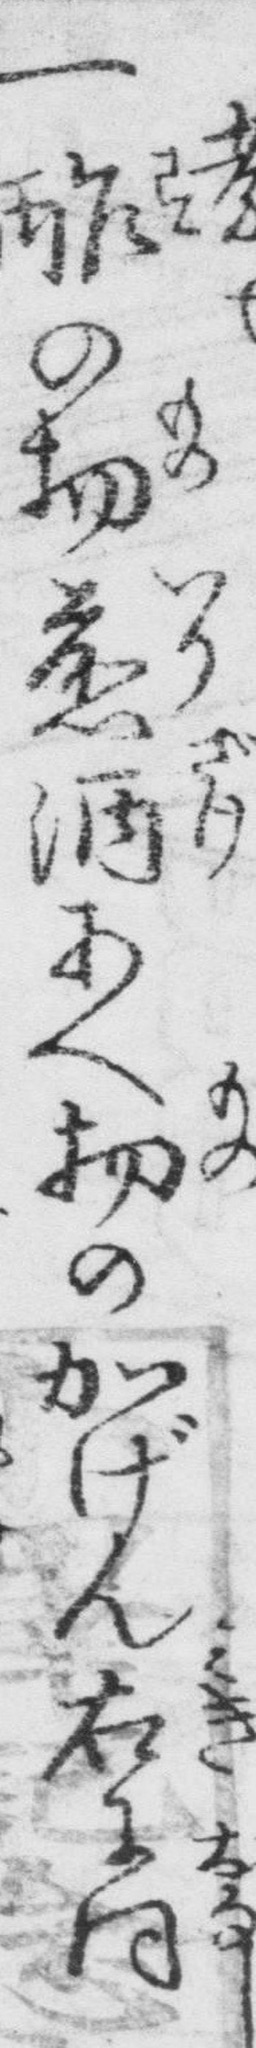一酢の物煎酒あへ物のかげん右に同
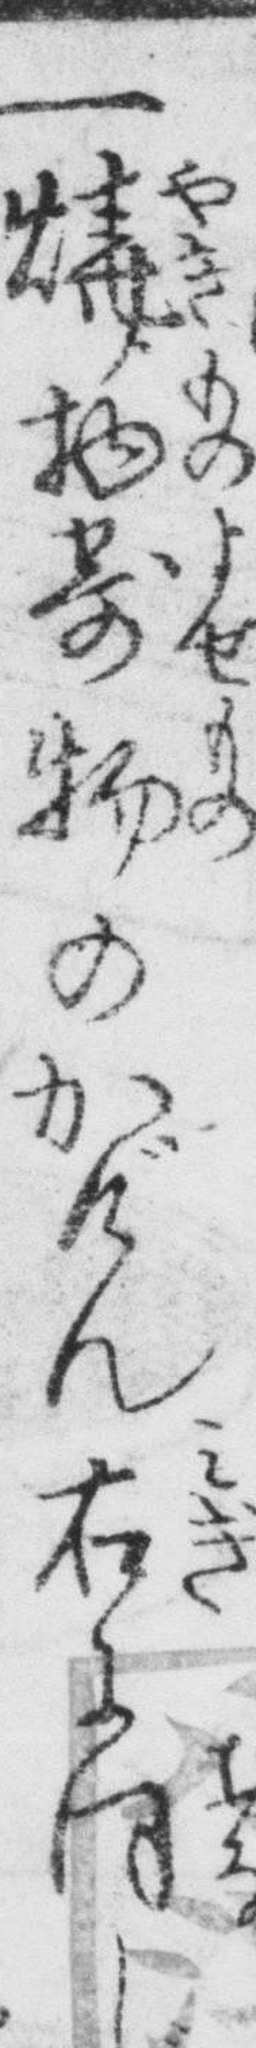一焼物寄物のかげん右に同し
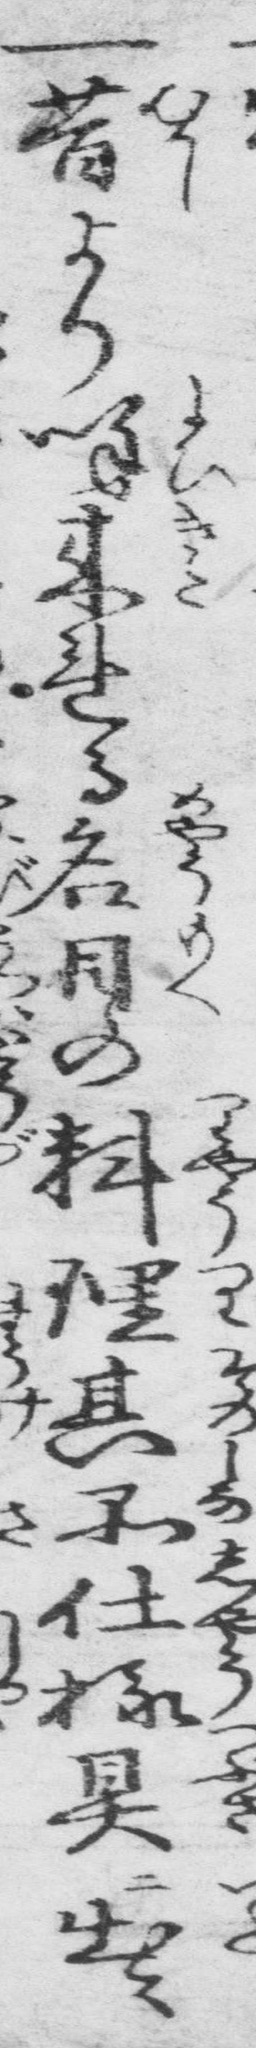一昔より呼来れる名目の料理其品仕様具に出す
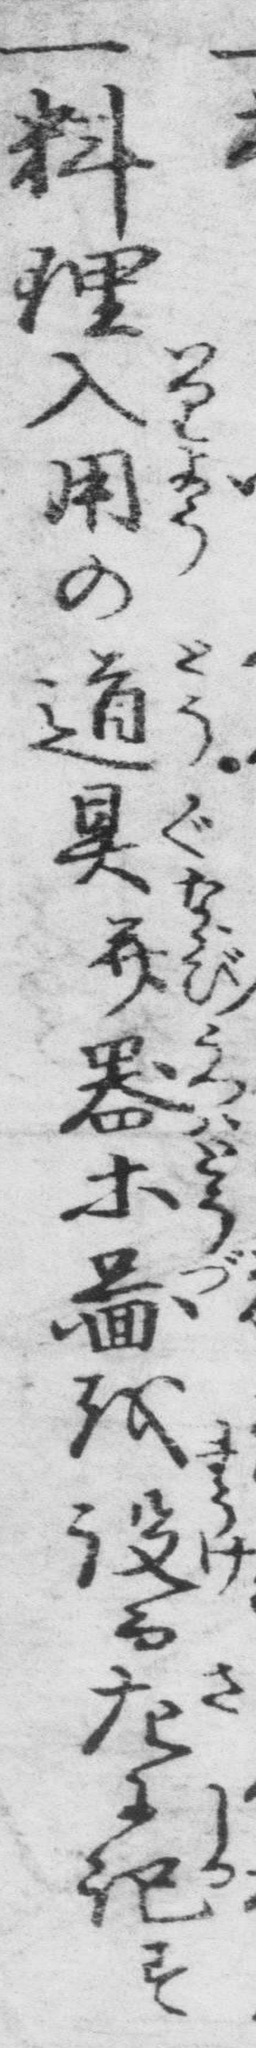一料理入用の道具并器等図を設而左に記す

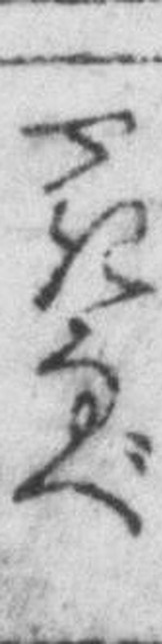やきなべ
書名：料理早指南
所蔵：大阪府立大学学術情報センター 国文学研究資料館
